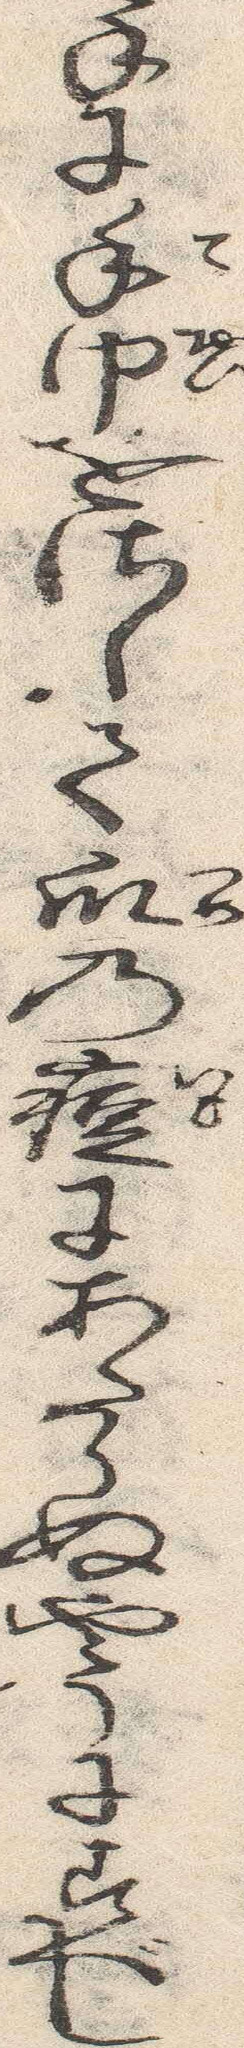手に手巾をさして爪の痘にあたらぬやうにすべし
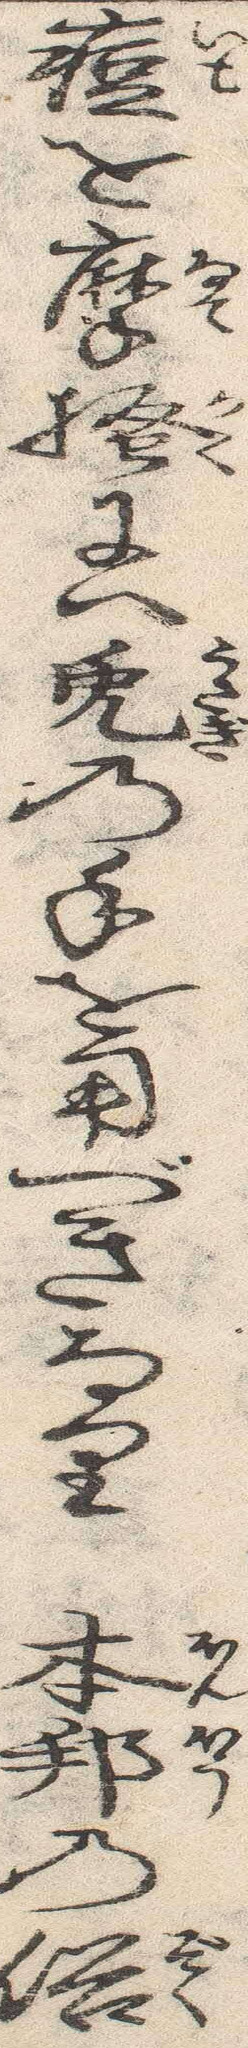痘を摩搔には兔の手を用べきなり本邦の俗
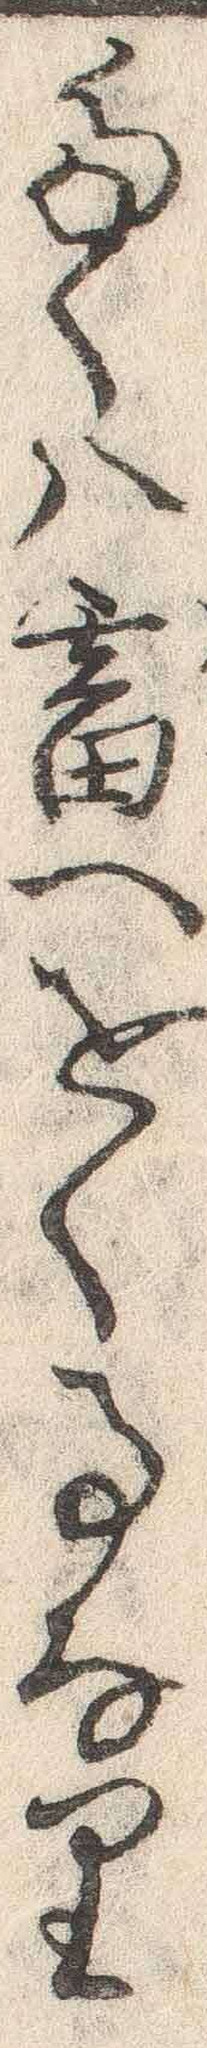多くは畜へをく事なり
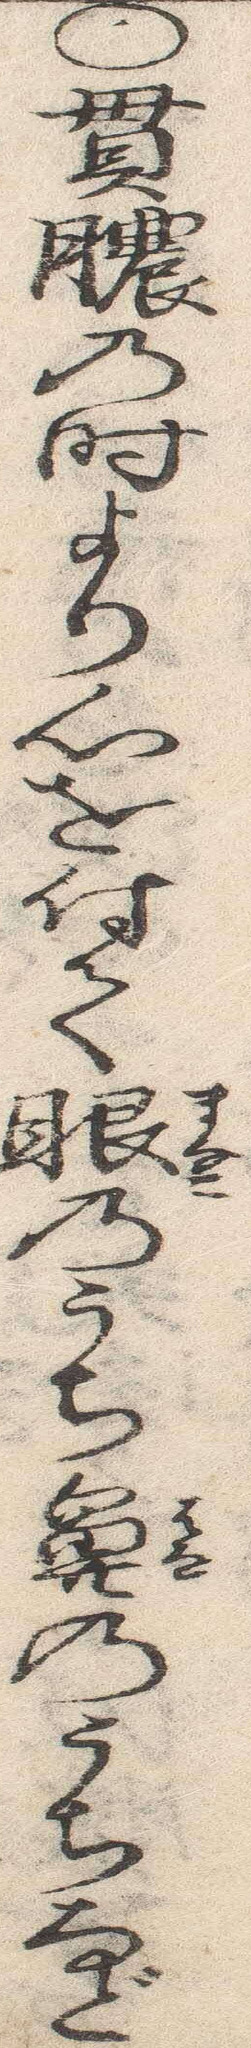○貫膿の時より心を付て眼のうち鼻のうちなど
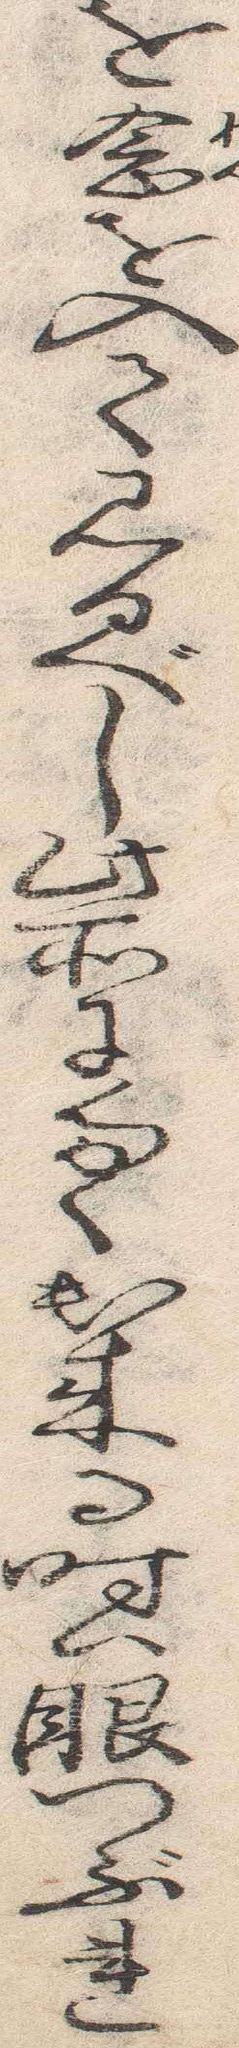を念を入て見るべし此所に多く出来る時は眼つぶれ
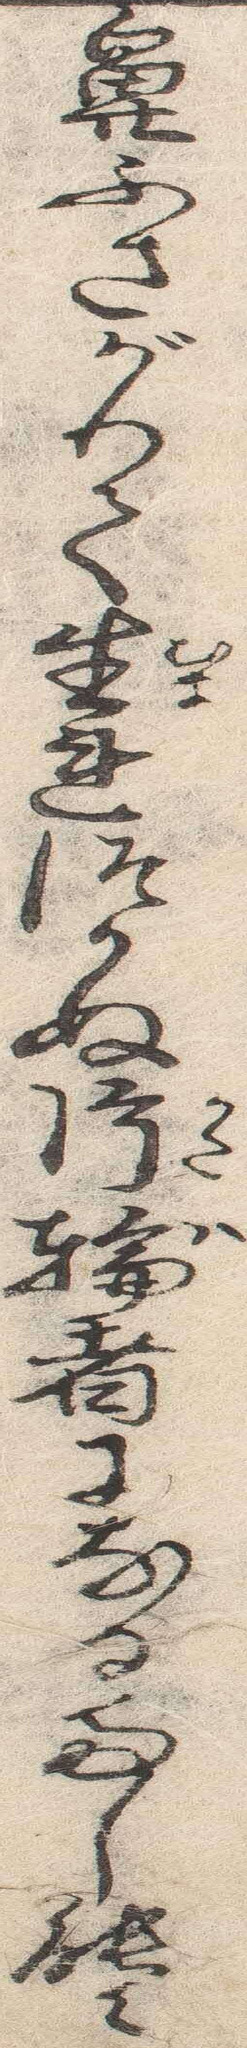鼻ふさがりて生れつかぬ片輪者になる多し能々
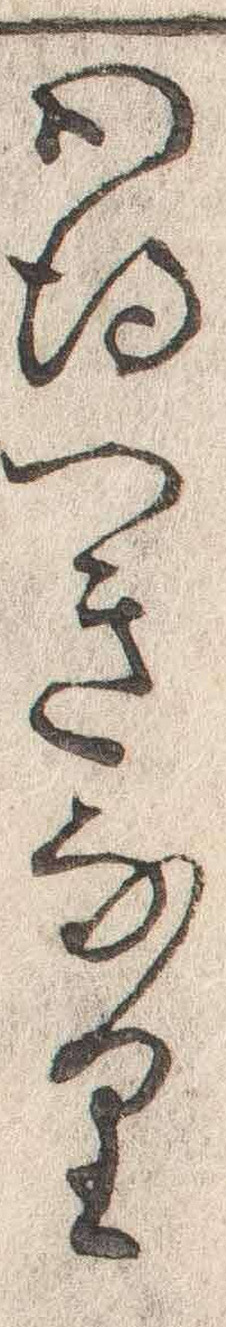心得へきなり
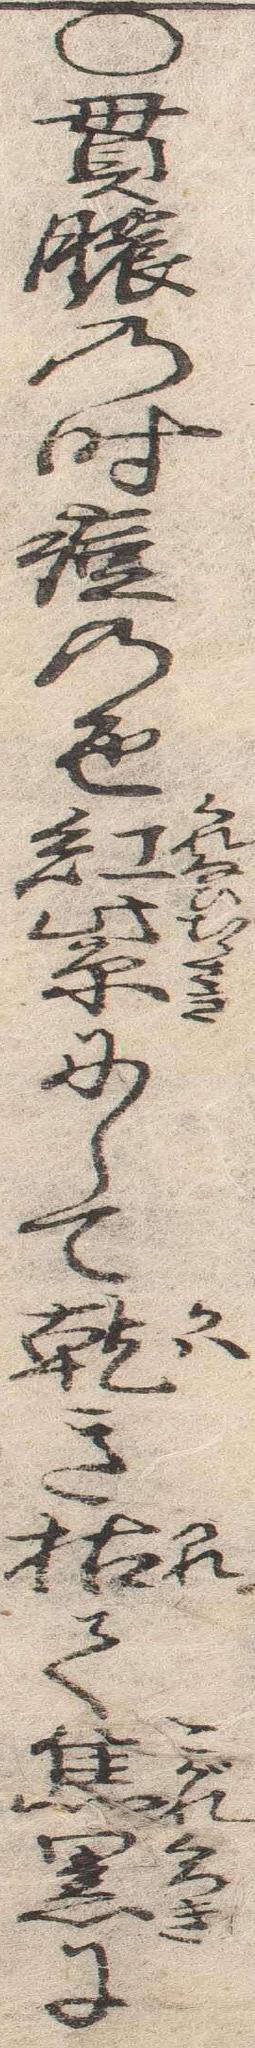○貫膿の時痘の色紅紫にして乾き枯て焦黒に
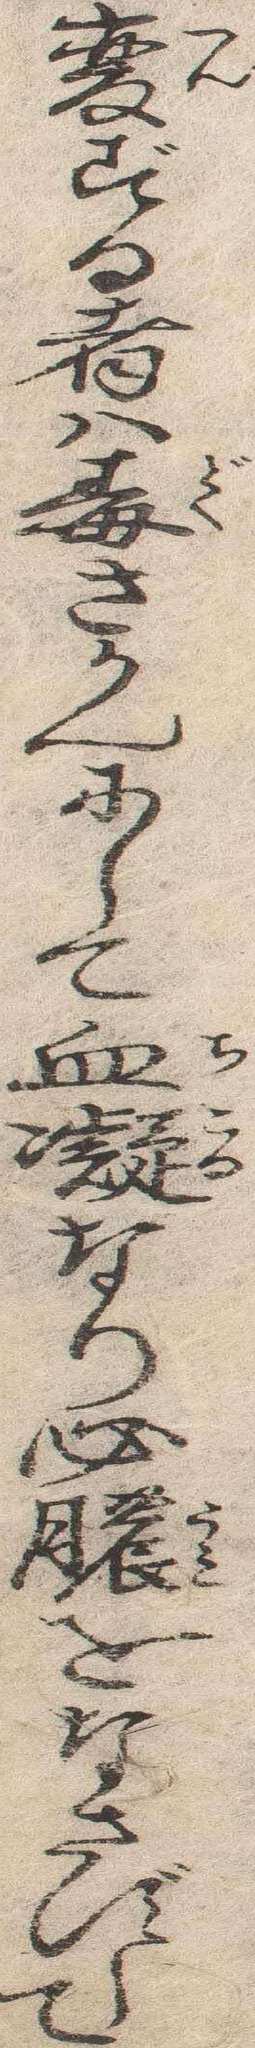変ずる者は毒さかんにして血凝なり必膿をなさずして

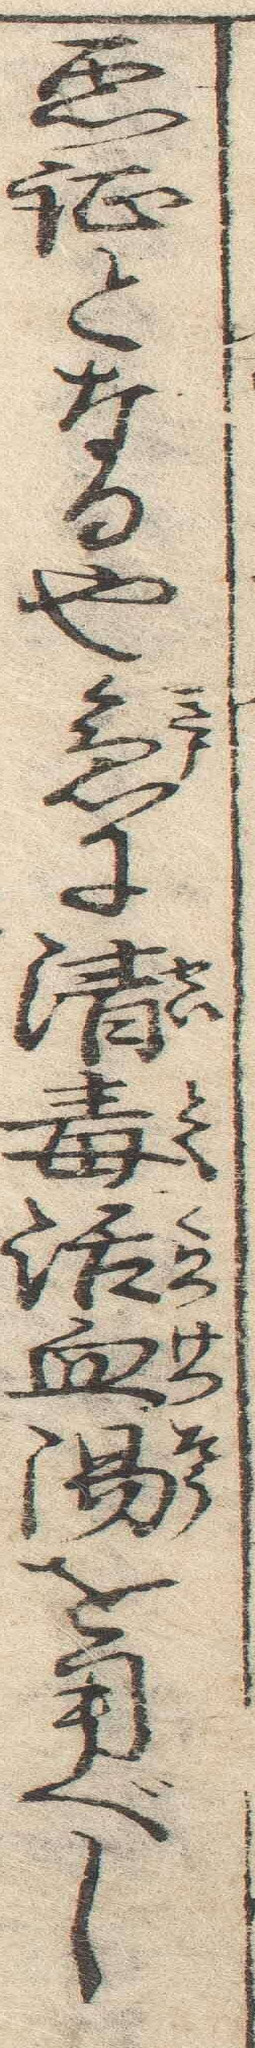悪証となる也急に清毒活血湯を用べし
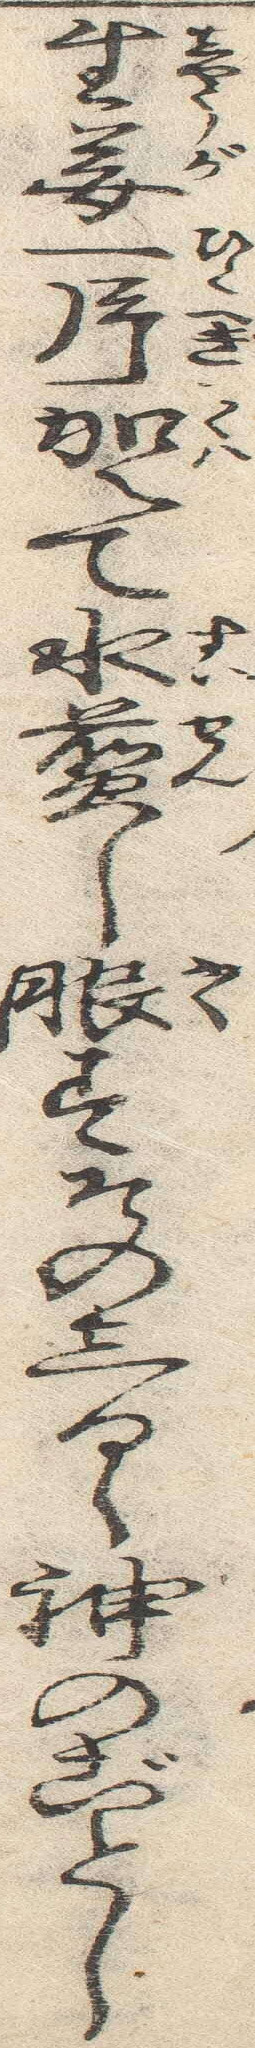生姜一片加えて水煎し服すそのしるし神のごとし
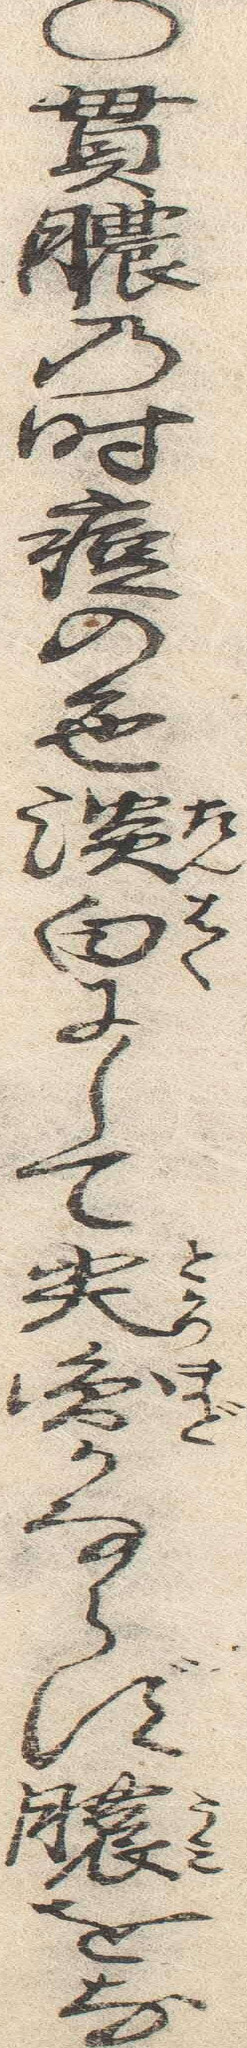○貫膿の時痘の色淡白にしてと尖円かならず膿をな
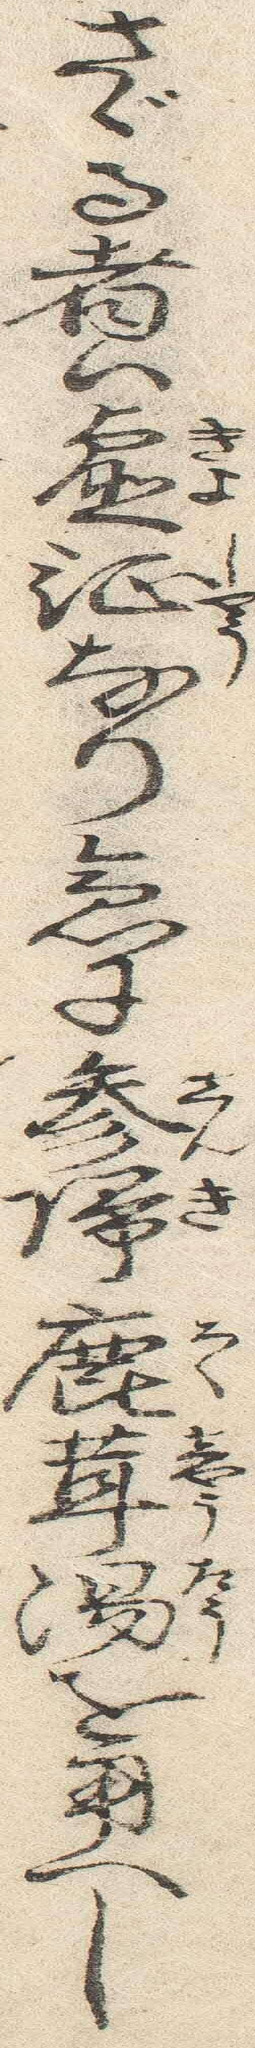さゞる者は虚証なり急に参帰鹿茸湯を用へし
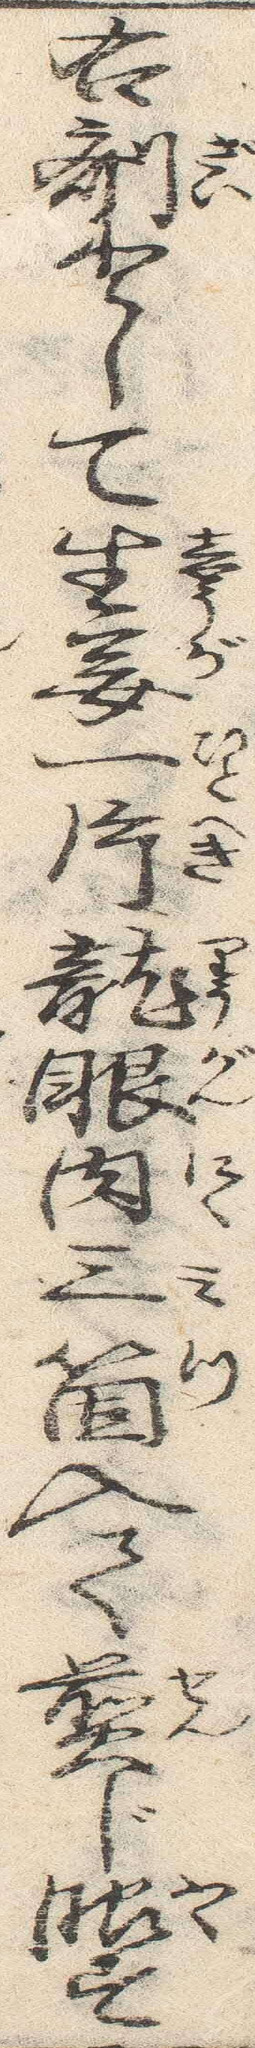右剤として生姜一片龍眼肉三箇入て煎じ服す
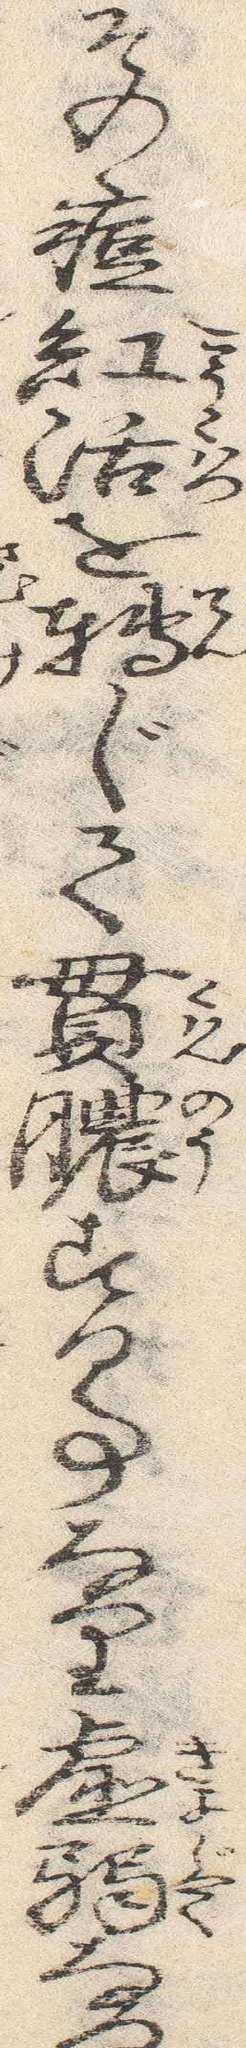その痘紅活を転じて貫膿する事なり虚弱なる
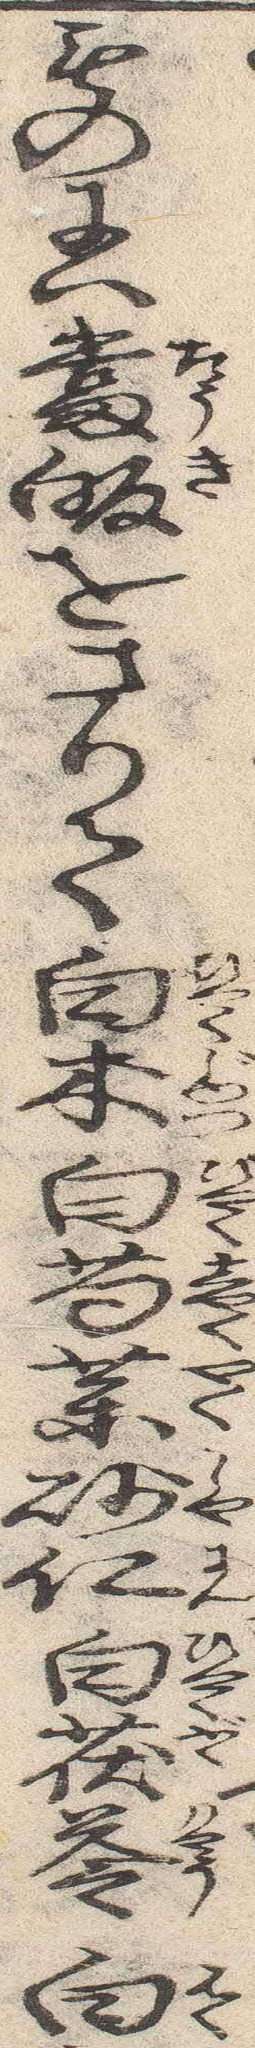ものには当皈をさりて白朮白芍薬砂仁白茯苓白
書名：小児必用養育草
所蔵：東京学芸大学附属図書館 国文学研究資料館
